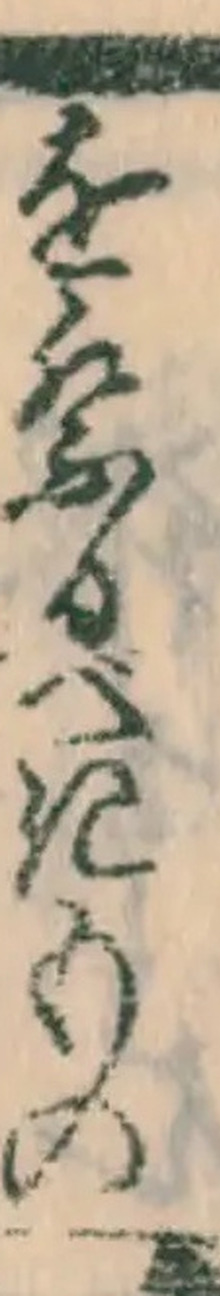を祭るべきもの
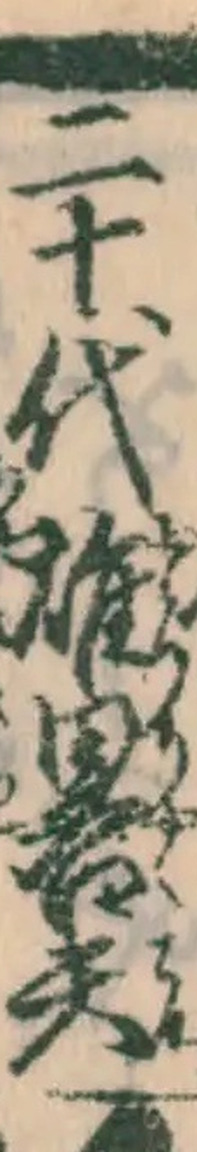二十代雄略天
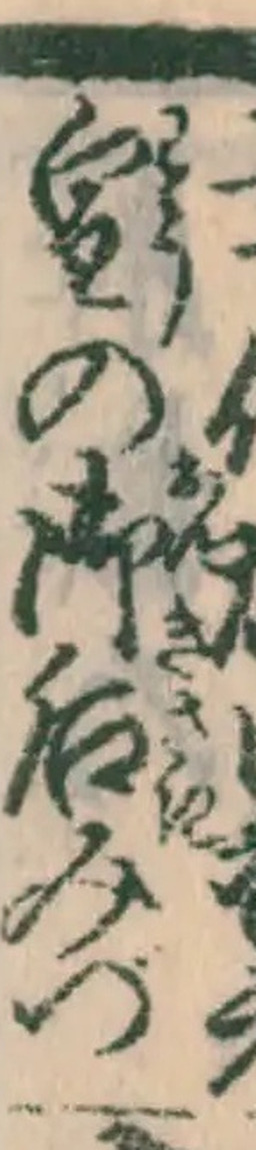皇の御后みづ
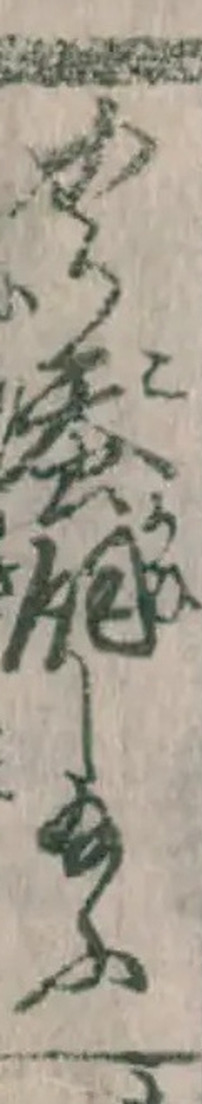から蚕飼し給ふ
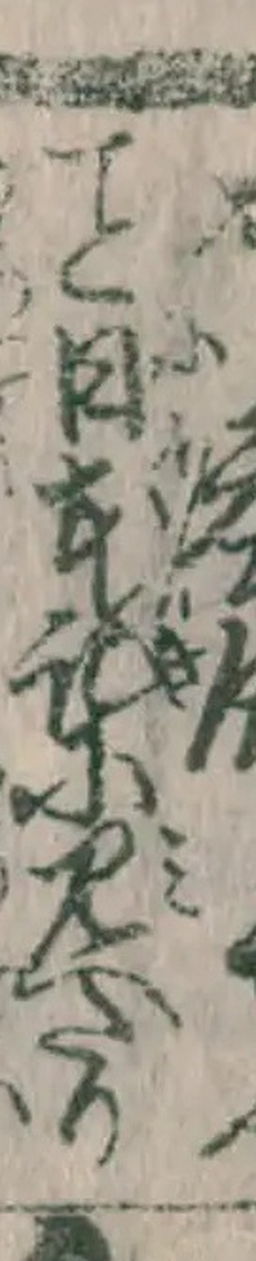こと日本記に見へたり
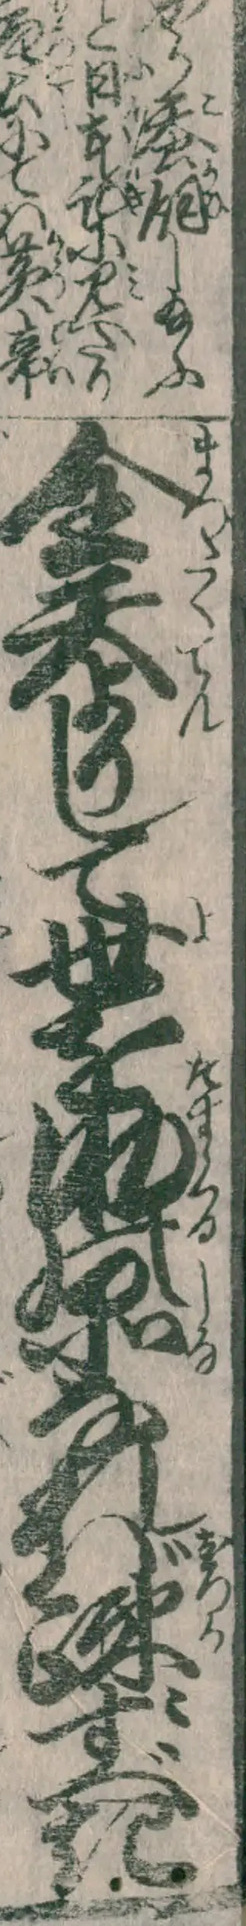全天よりして世を助の品なれば疎にすべき
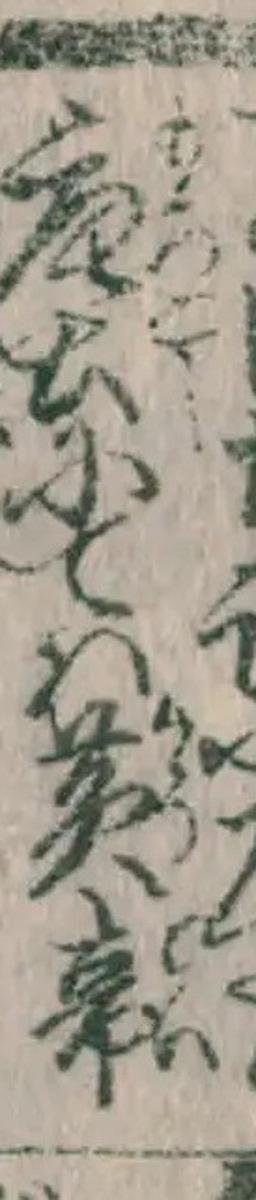唐土にては黄帝
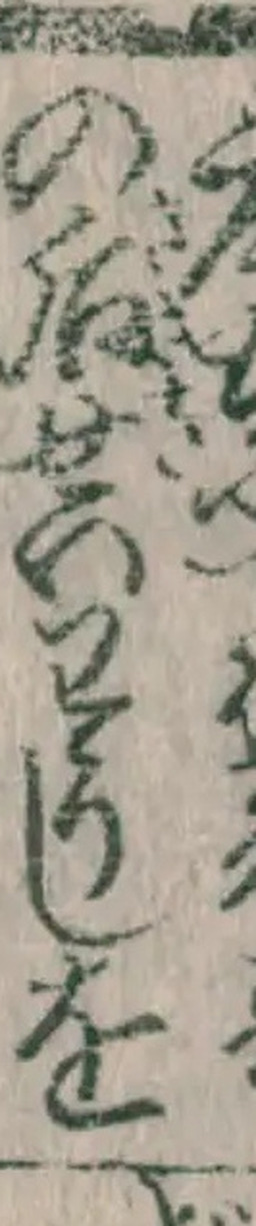の后せいわうしを
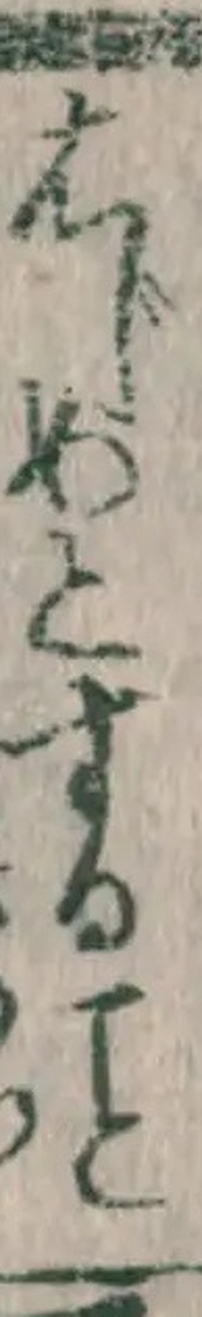はじめとすること
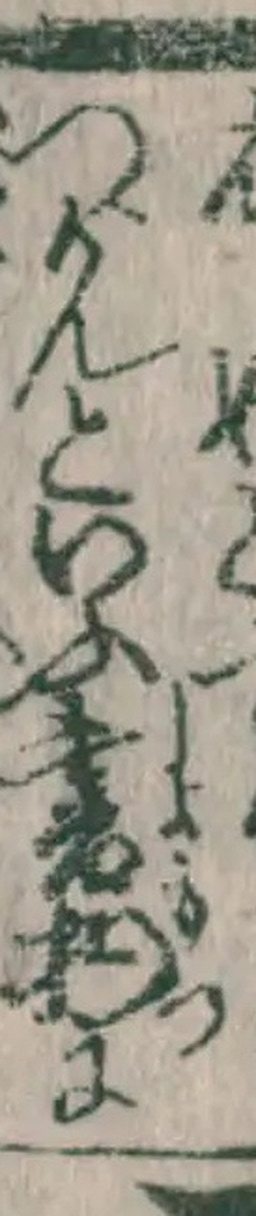つかんといふ書物に
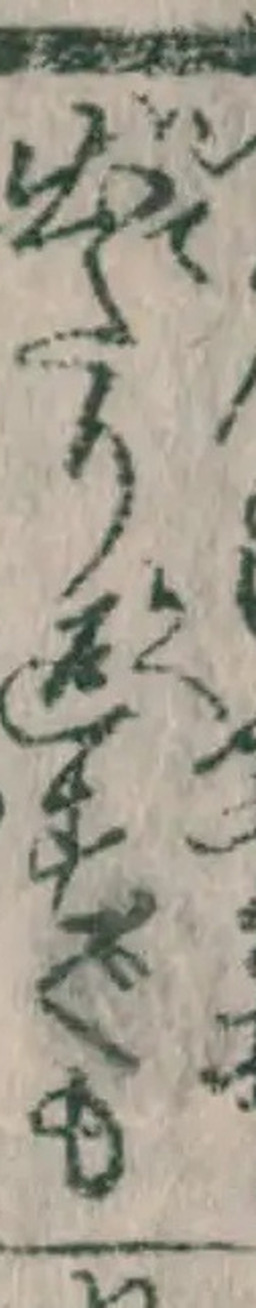出たり返す〴〵も
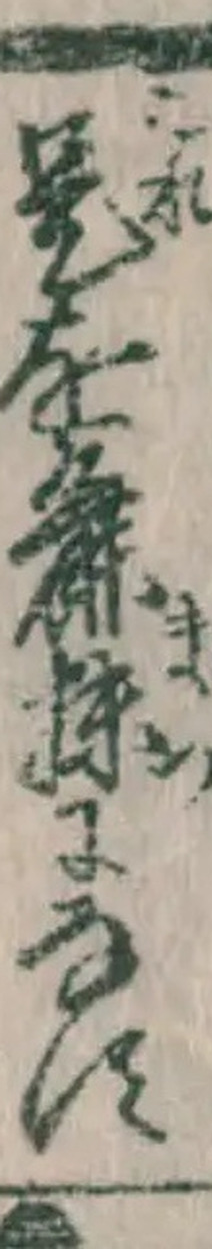是を麁抹になす
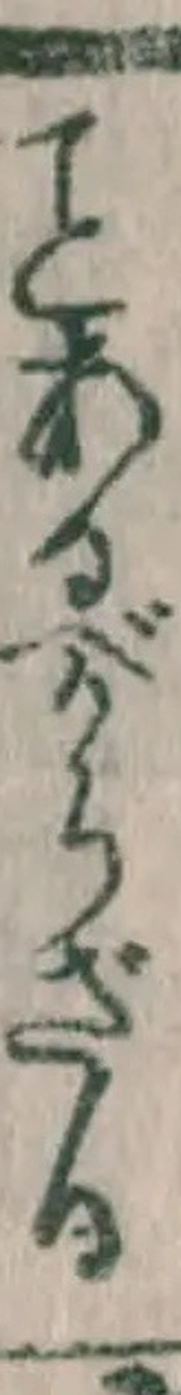ことあるべからざる
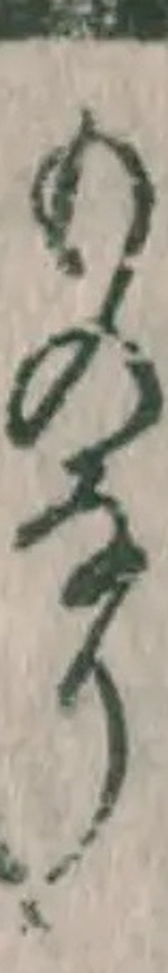ものなり
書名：養蚕往来
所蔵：国立国会図書館 National Diet Library, JAPAN
